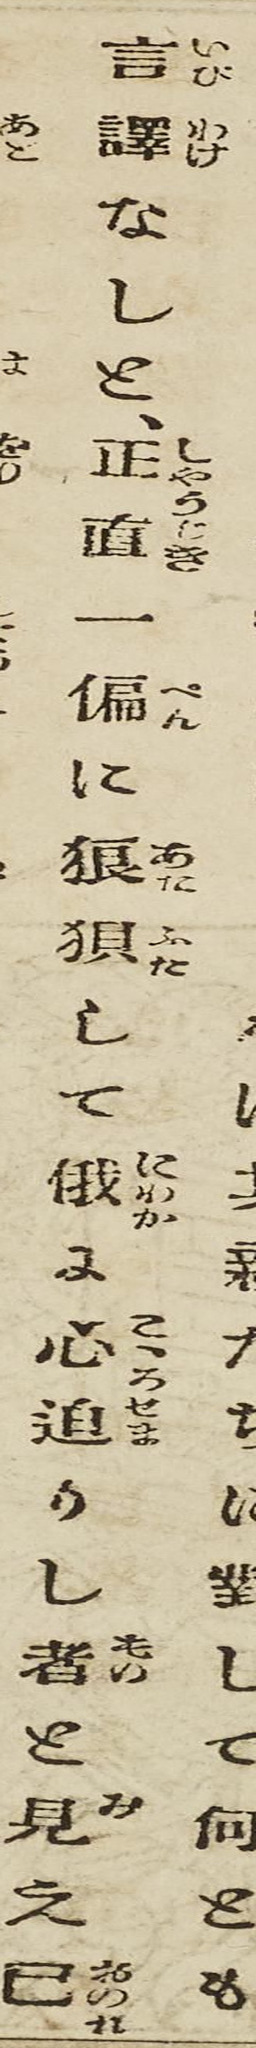言訳なしと、正直一偏に狼狽して俄に心迫りし者と見え己
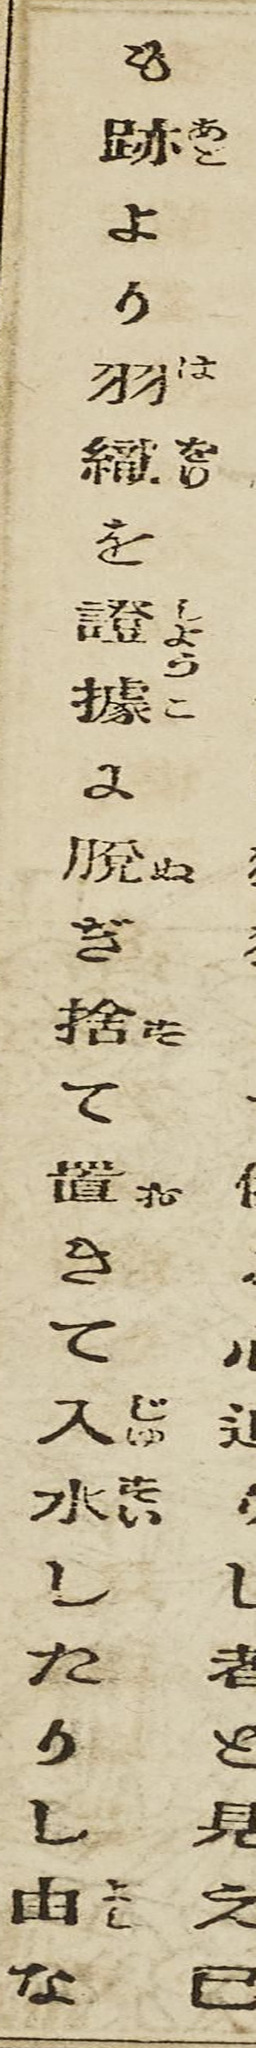も跡より羽織を証拠に脱ぎ捨て置きて入水したりし由な
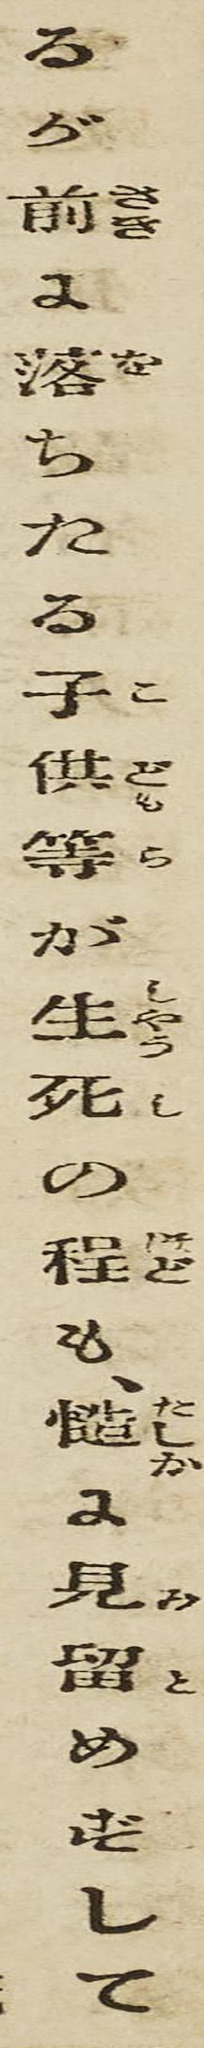るが前に落ちたる子供等が生死の程も、慥に見留めずして
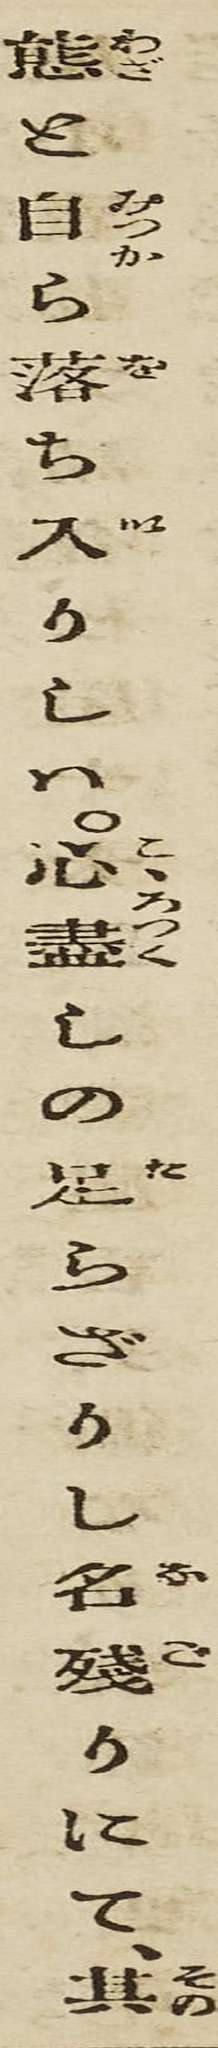態と自ら落ち入りしは。心尽しの足らざりし名残りにて、其
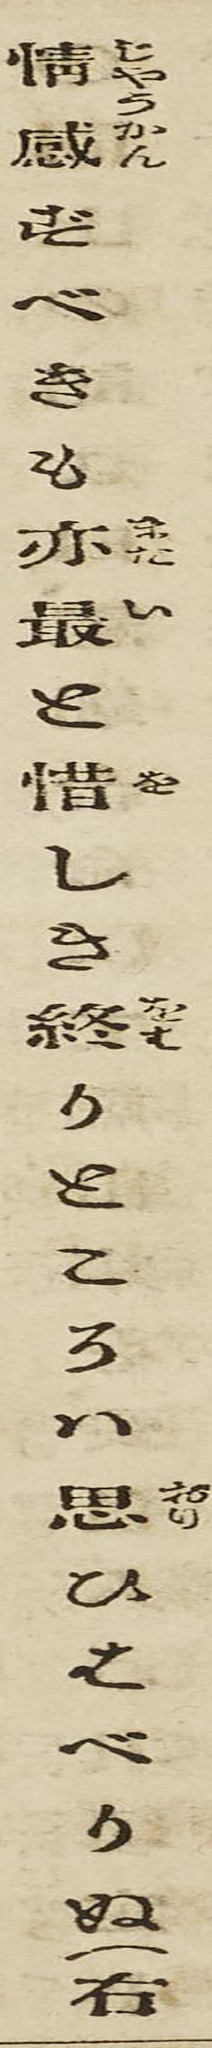情感ずべきも亦最と惜しき終りとこそは思ひはべりぬ（右
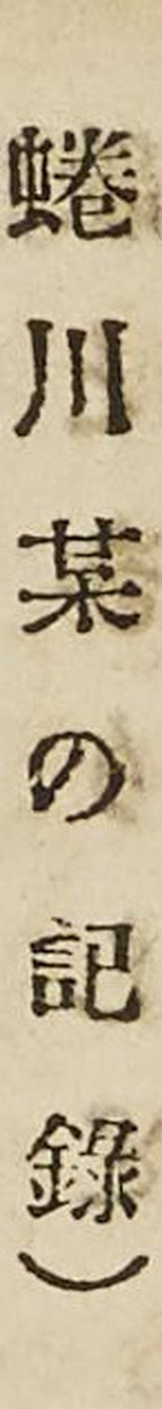蜷川某の記録）

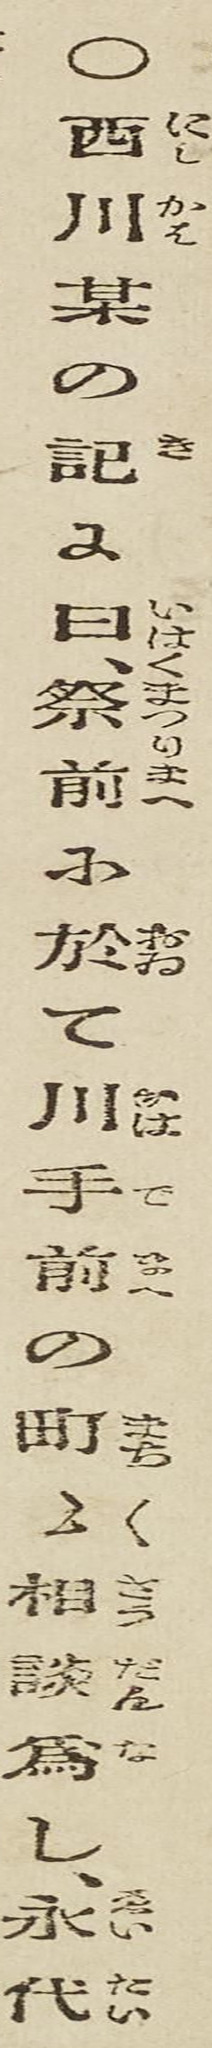○西川某の記に曰、祭前に於て川手前の町〻相談為し、永代
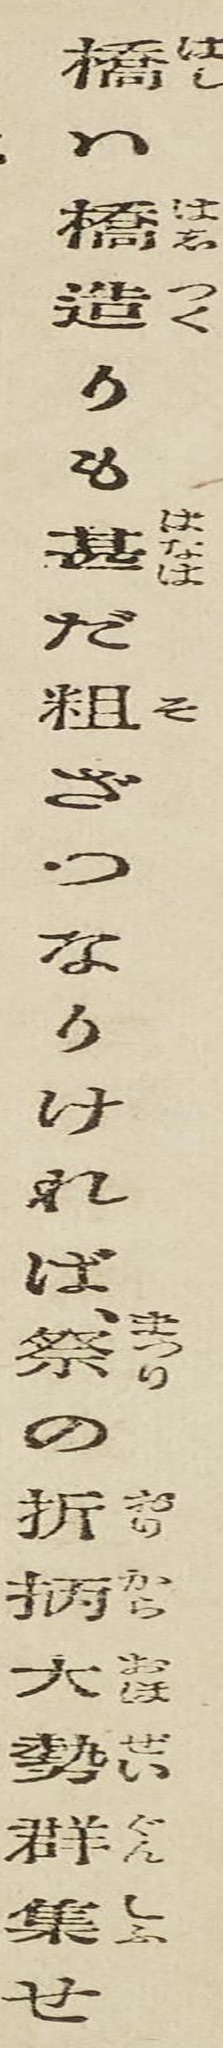橋は橋造りも甚だ粗ざつなりければ、祭の折柄大勢群集せ
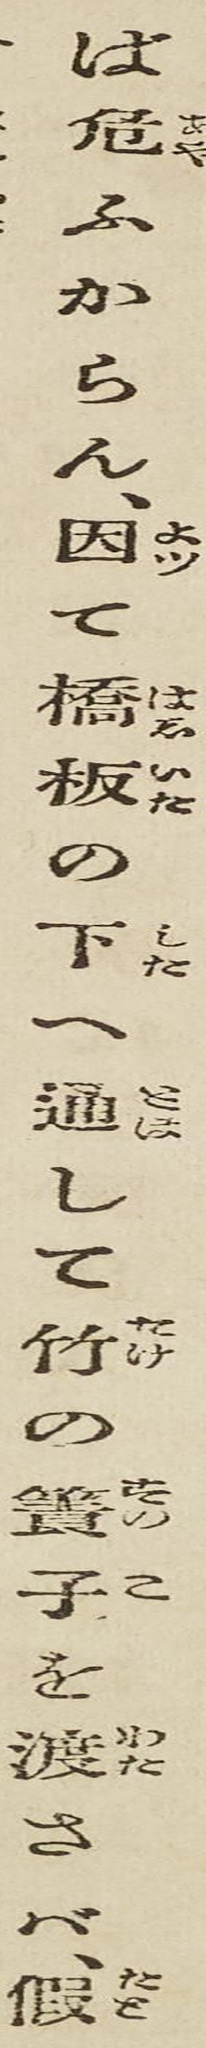ば危ふからん、因て橋板の下へ通して竹の簀子を渡さば、仮
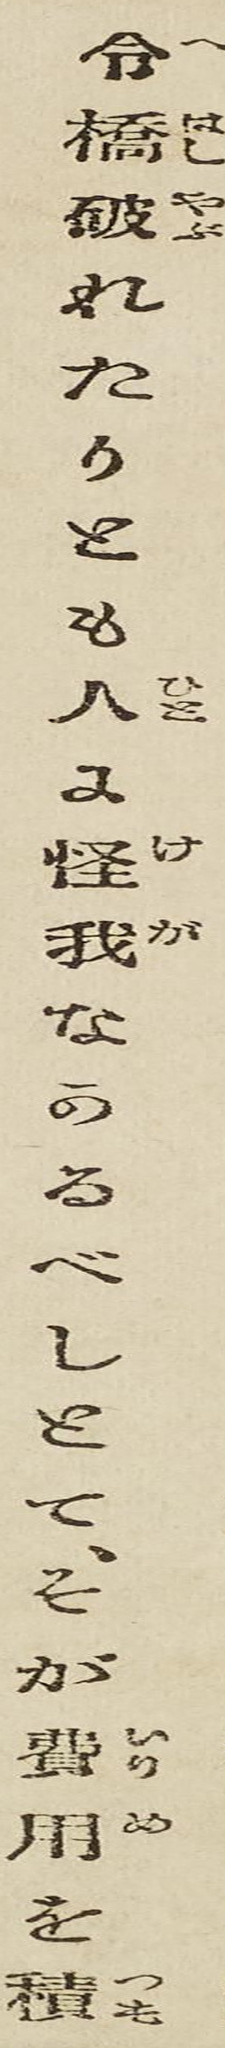令橋破れたりとも人に怪我なかるべしとて、そが費用を積
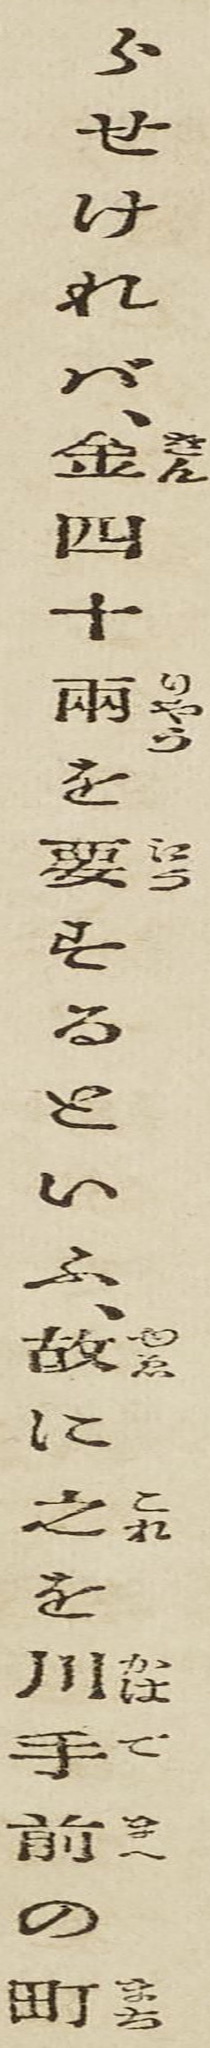らせければ、金四十両を要するといふ、故に之を川手前の町
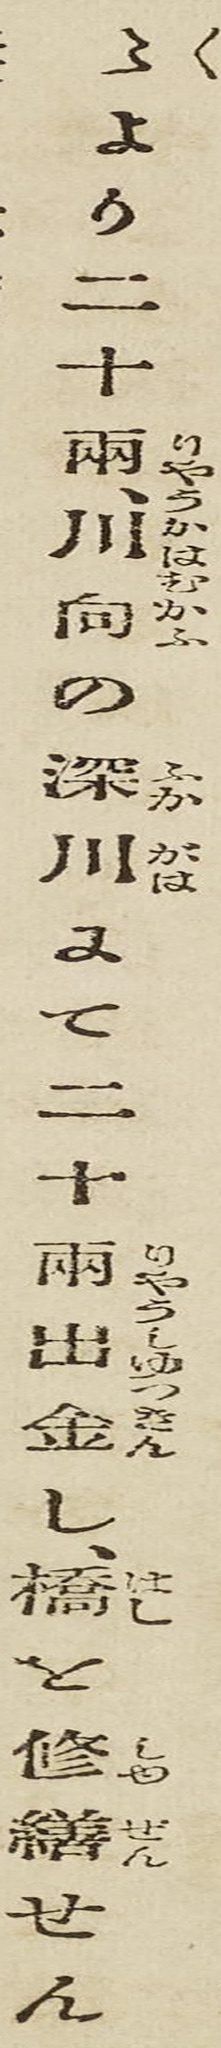〻より二十両、川向の深川にて二十両出金し、橋を修繕せん
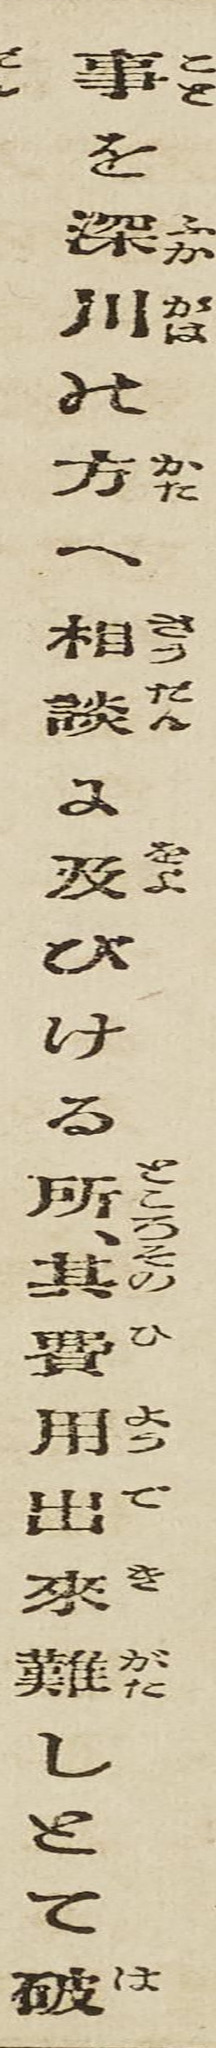事を深川の方へ相談に及びける所、其費用出来難しとて破
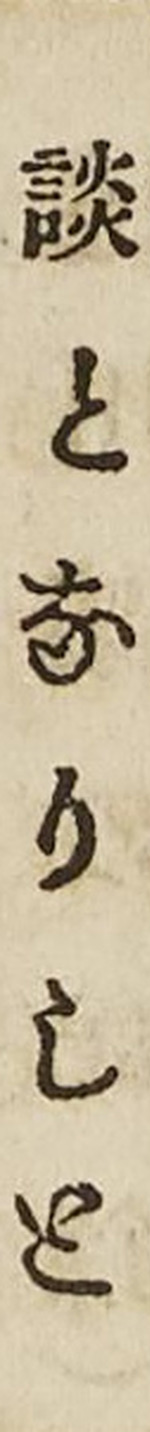談となりしと
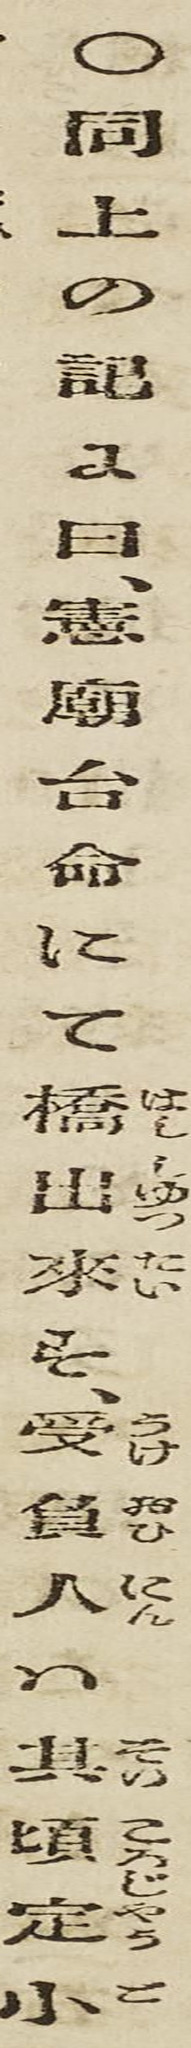○同上の記に曰、憲廟台命にて橋出来す、受負人は其頃定小
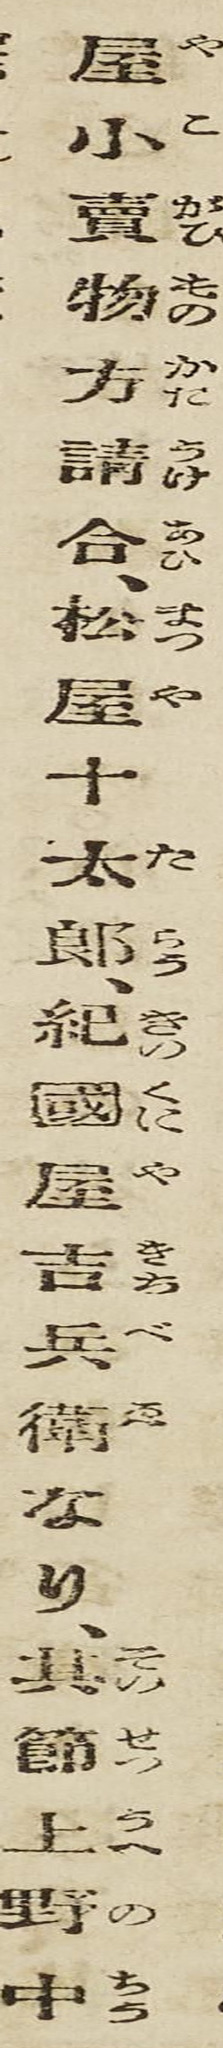屋小買物方請合、松屋十太郎、紀国屋吉兵衛なり、其節上野中
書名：永代惨話　文化の夢　全
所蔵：東京大学地震研究所図書室 Earthquake Research Institute Library, The University of Tokyo, JAPAN
